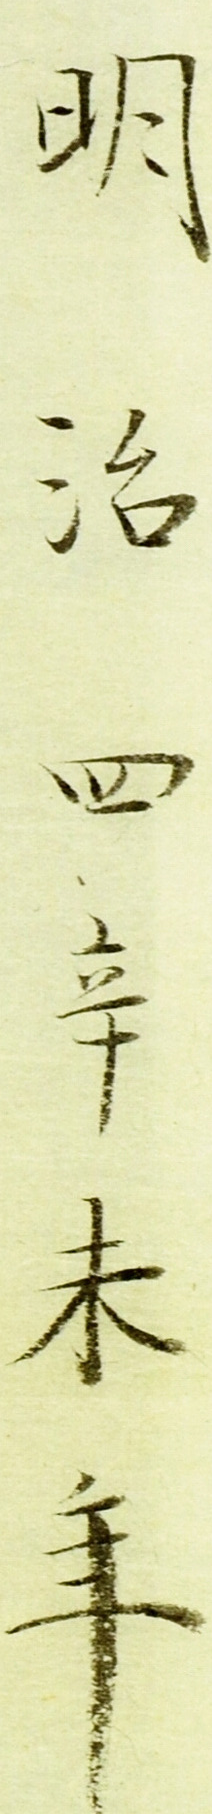明治四辛未年
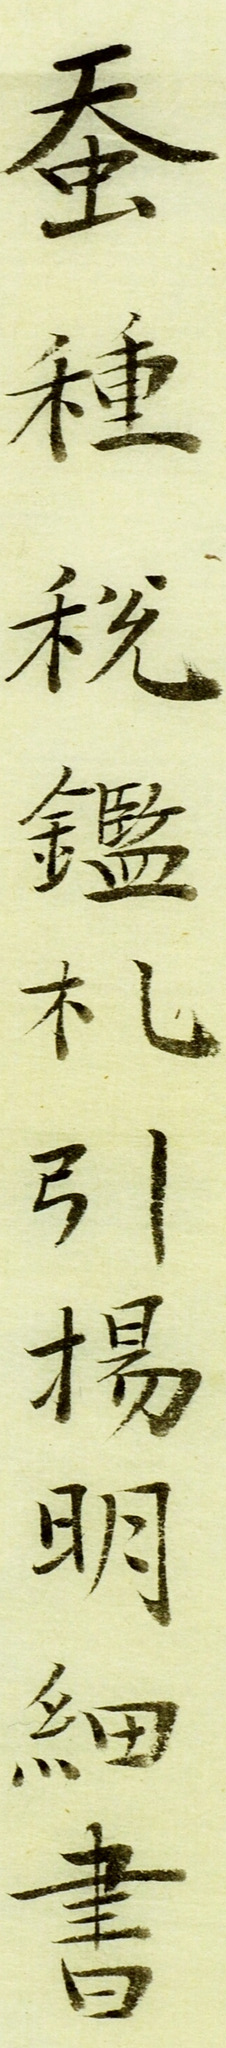蚕種税鑑札引揚明細書
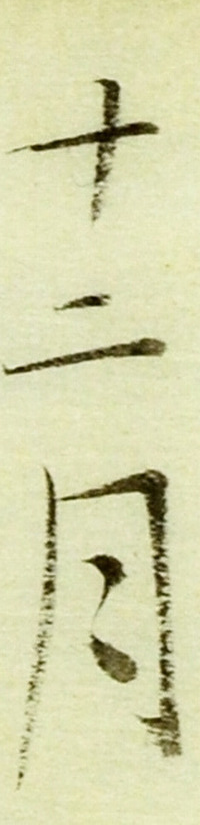十二月
